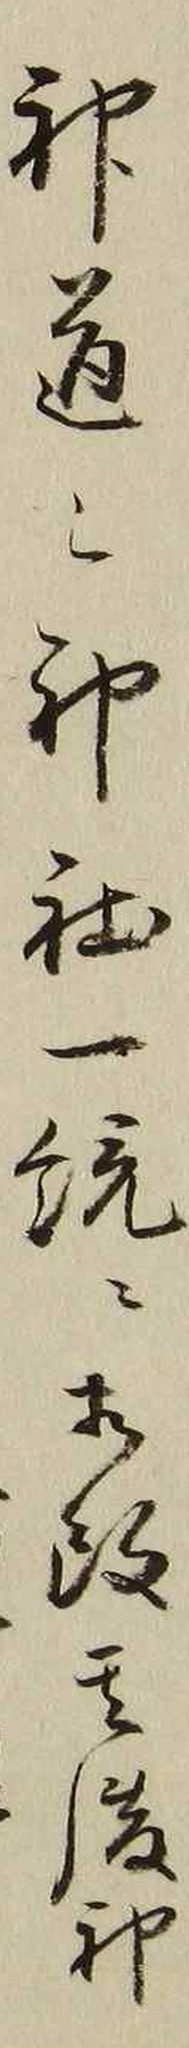神道之神社一統ニ相改其後神
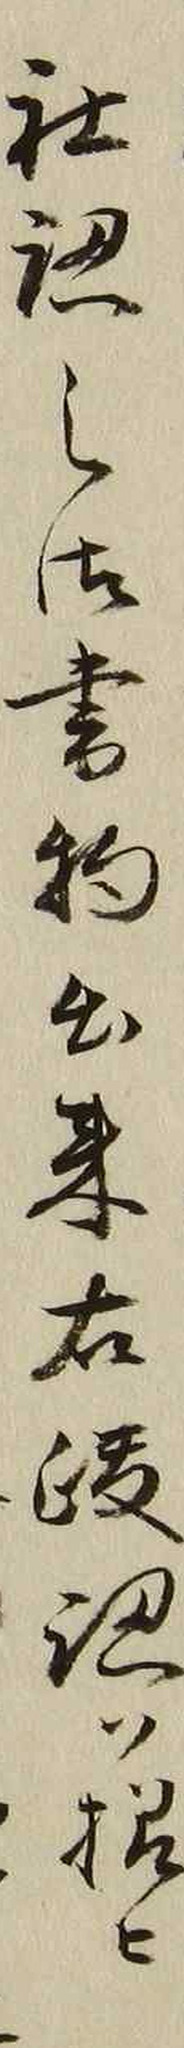社認之御書物出来右跋認候様被
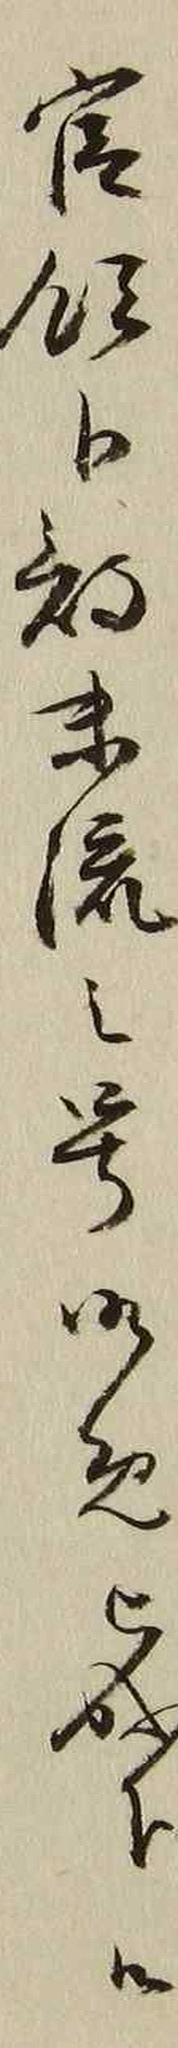官領卜部末流之号御免被成下候
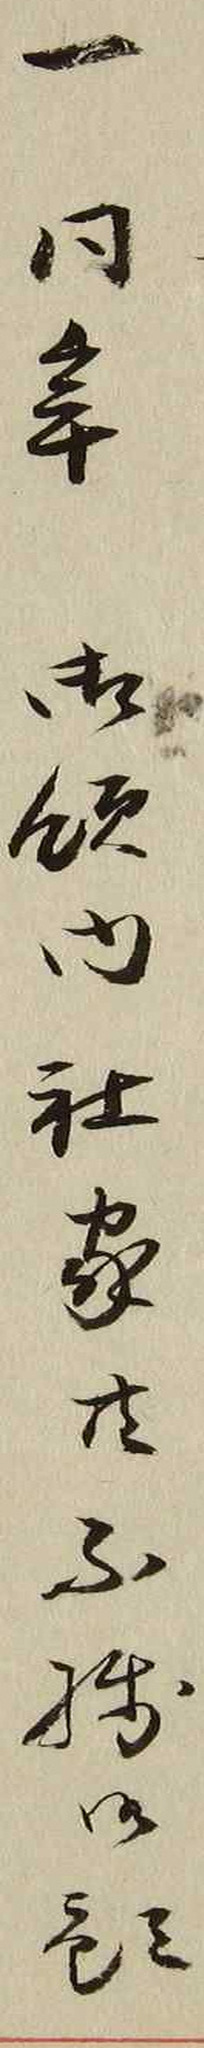一同年御領内社家共不残御預
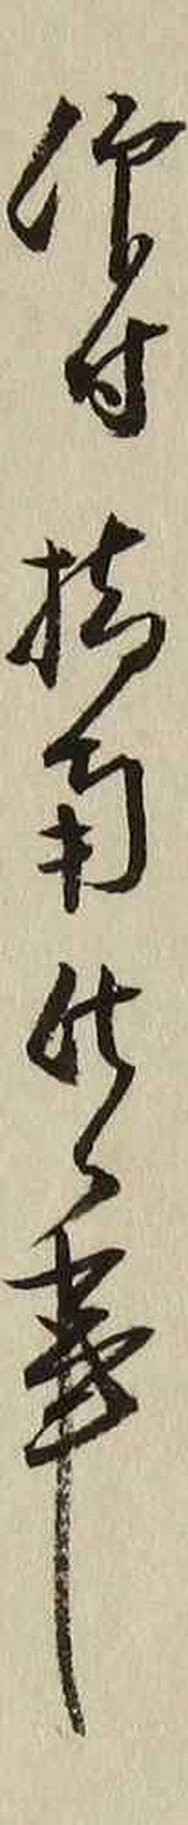仰付指南仕候事
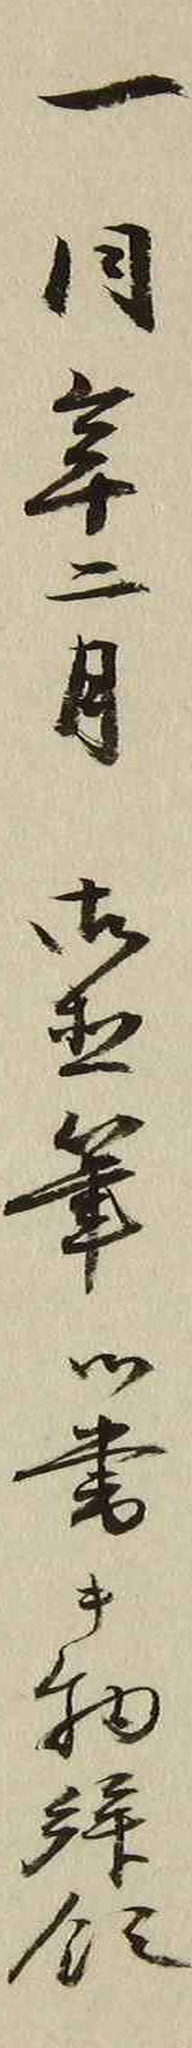一同年二月御直筆御書キ物拝領
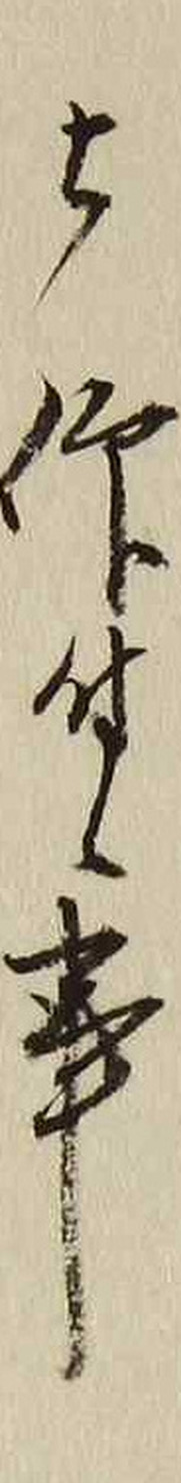被仰付候事
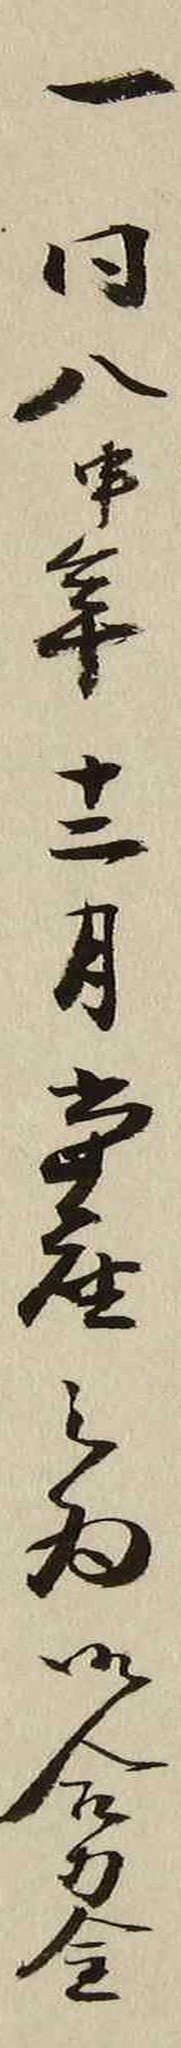一同八申年十二月当座之為御合力金
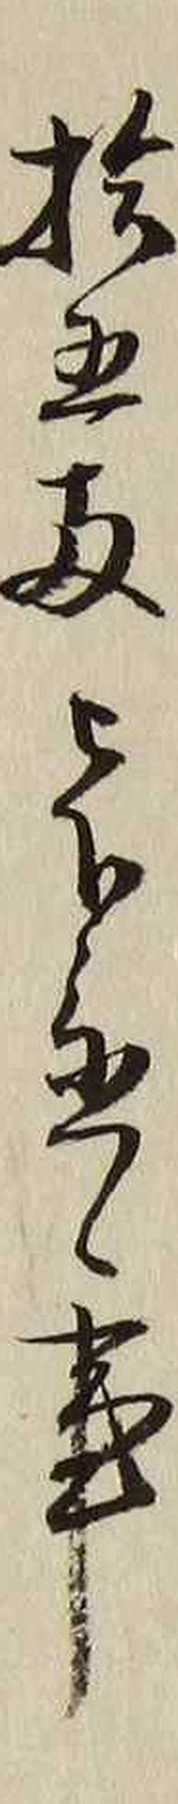拾五両被下置候事
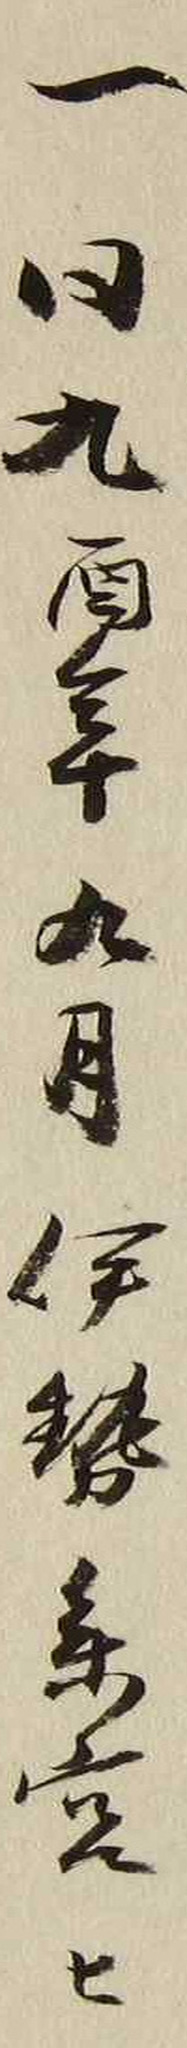一同九酉年九月伊勢参宮被
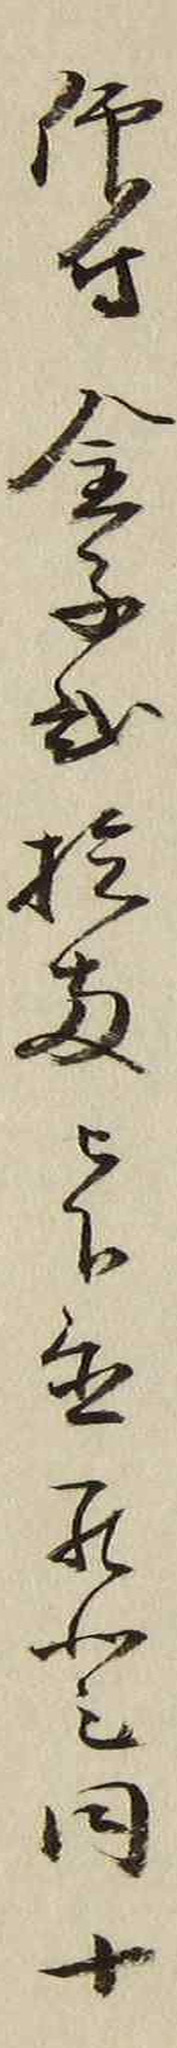仰付金子弐拾両被下置罷登同十
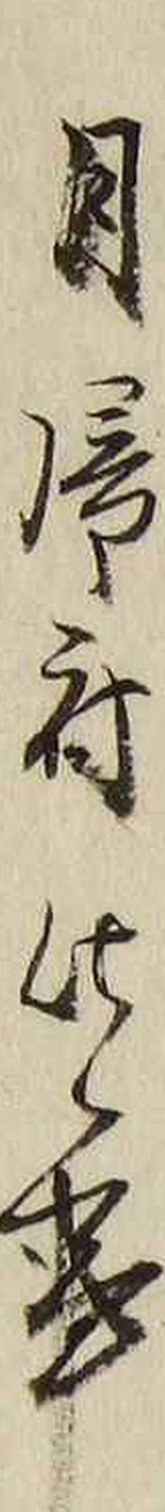月帰府仕候事
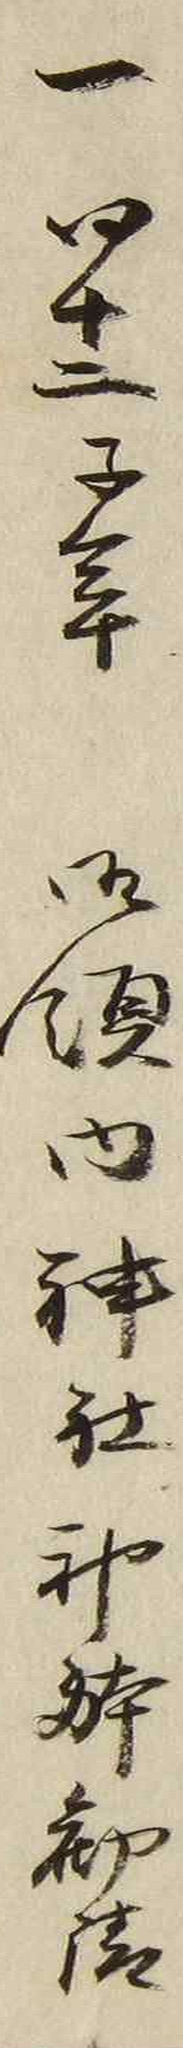一同十二子年御領内神社神体勧請

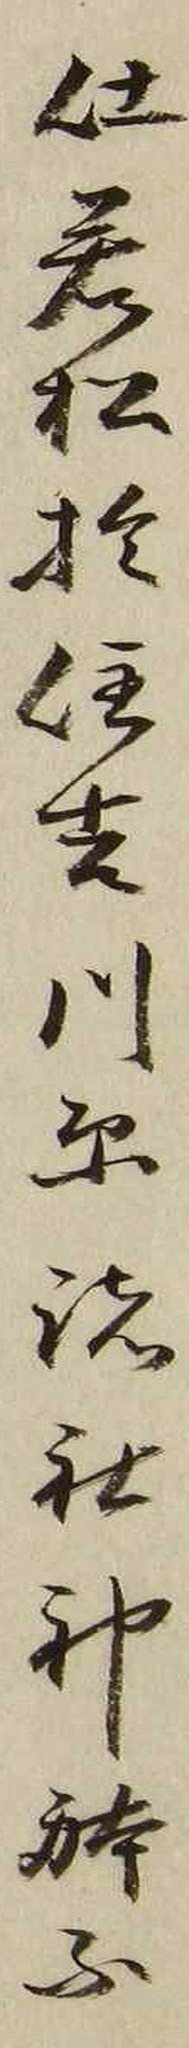仕若松於住吉川原諸社神体不
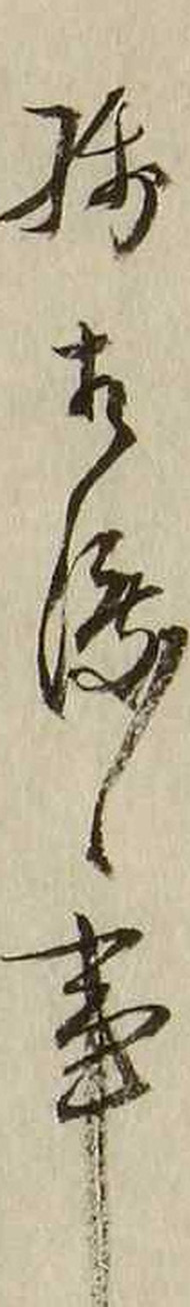残相渡候事
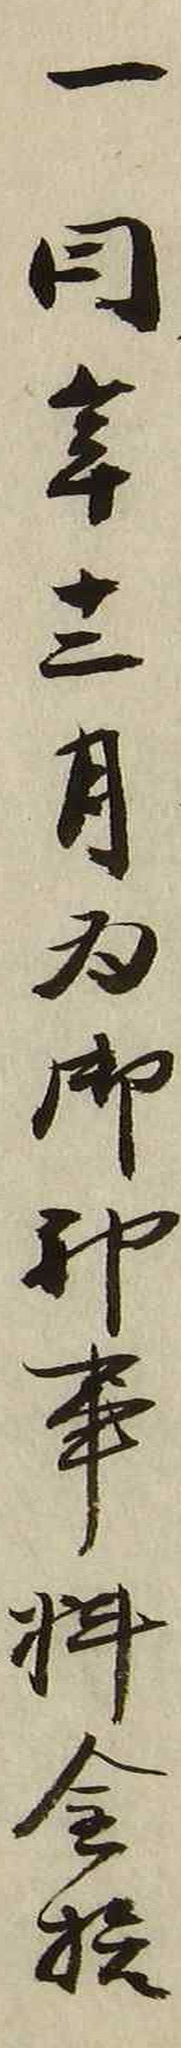一同年十二月為御神事料金拾
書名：諸士系譜　巻之291　さ之部23
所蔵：会津若松市立会津図書館
